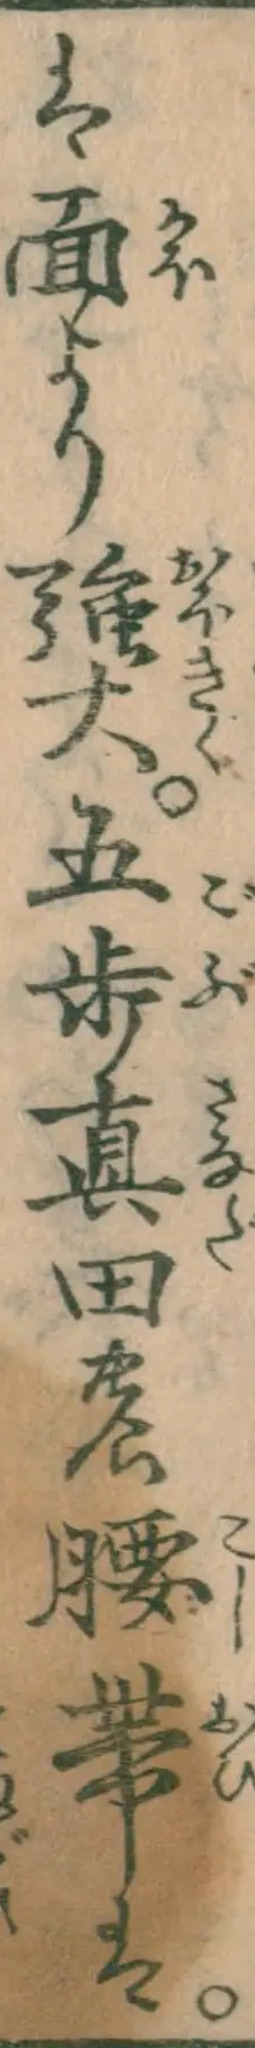は面より強大。五歩真田の腰帯は
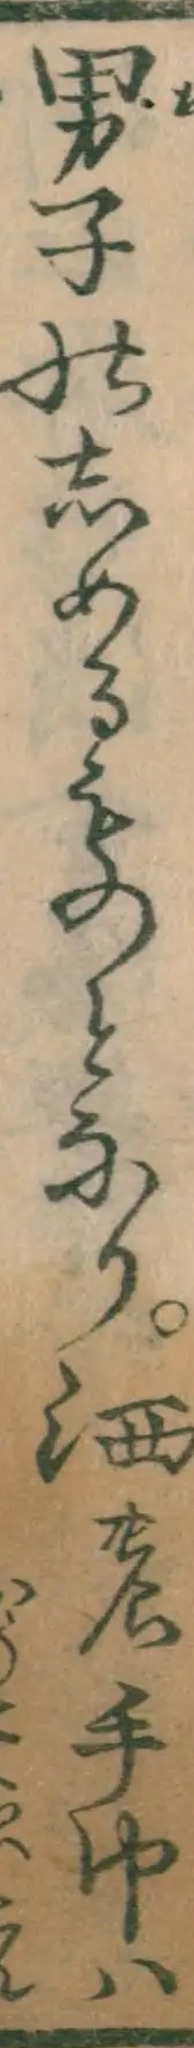男子のしめるものとなり。洒の手巾は。
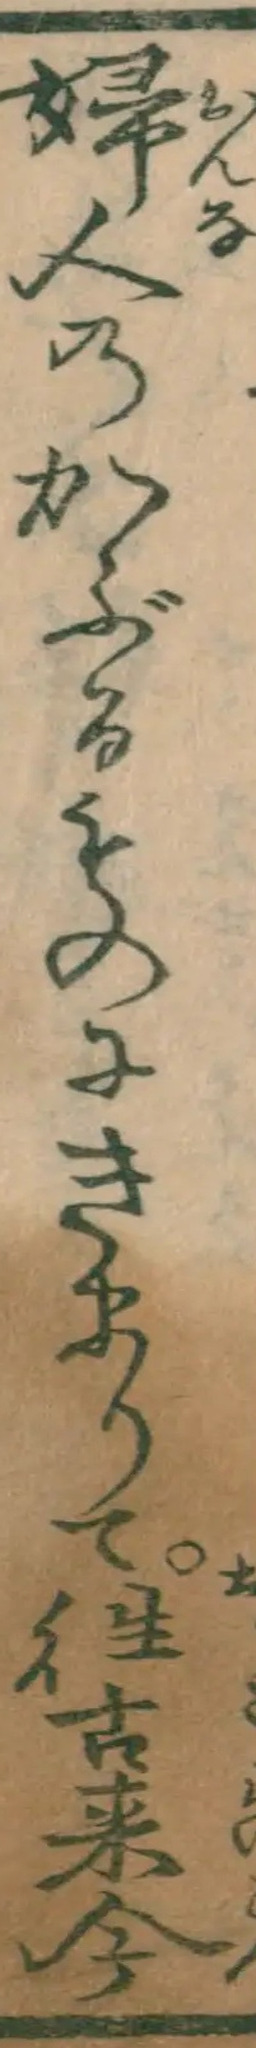婦人のかぶるものにきまりて。往古来今

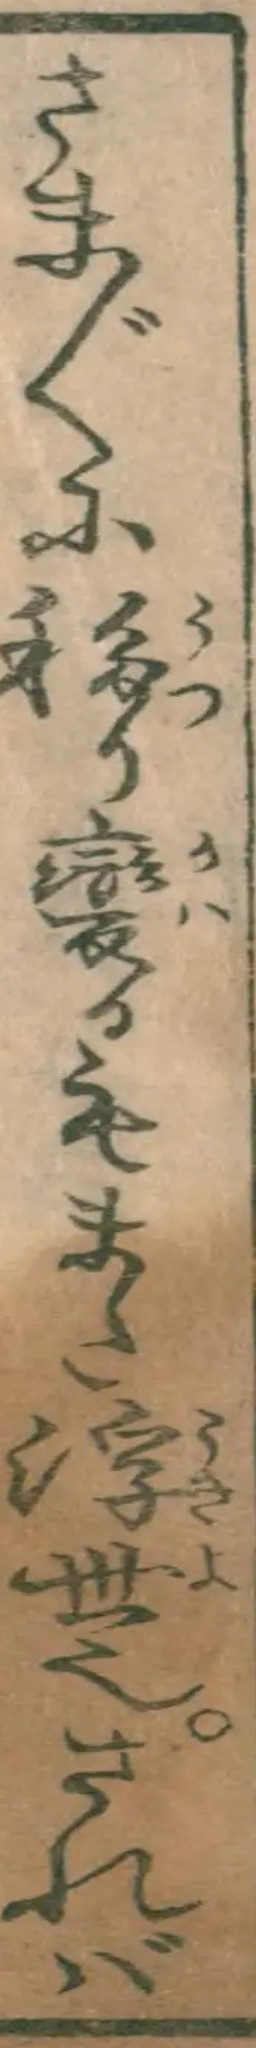さま〴〵に移り変るもまた浮世也。されば
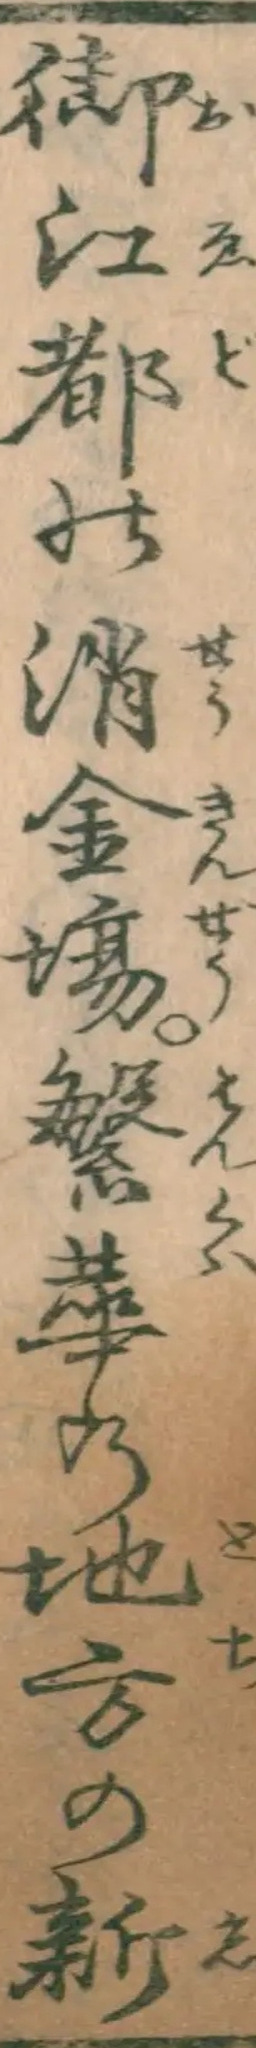御江都の消金場。繁華の地方の新
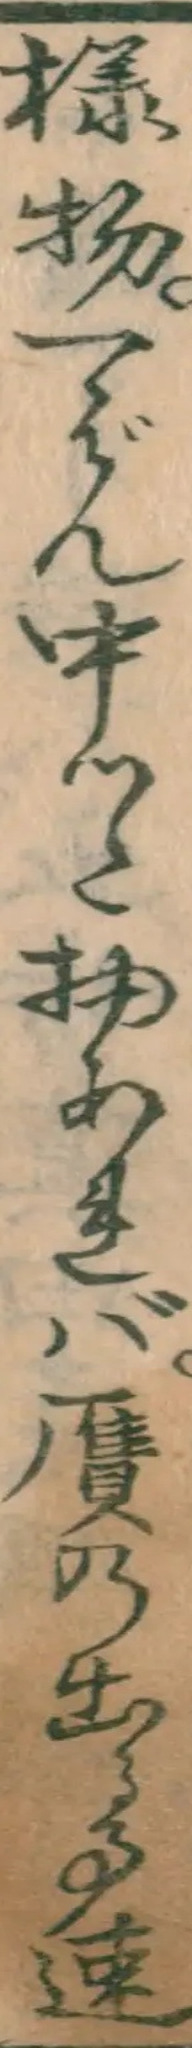様物。一ばん中つた物あれば。贋の出る事速
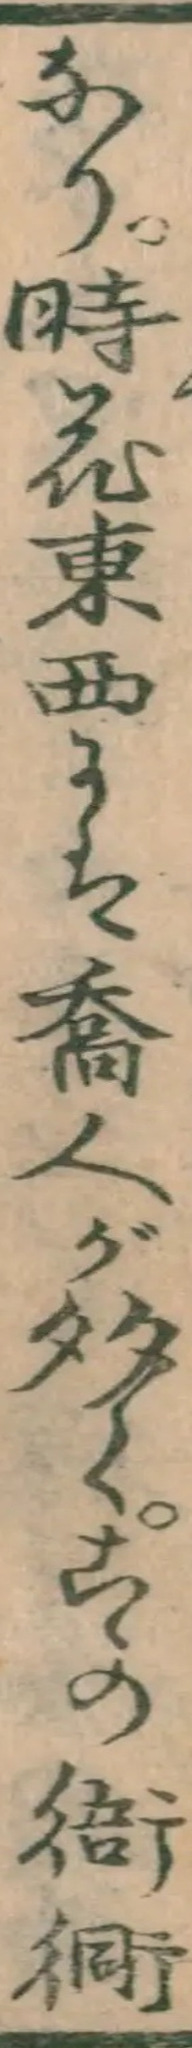なり。時花東西には喬人が多く。この衙衕
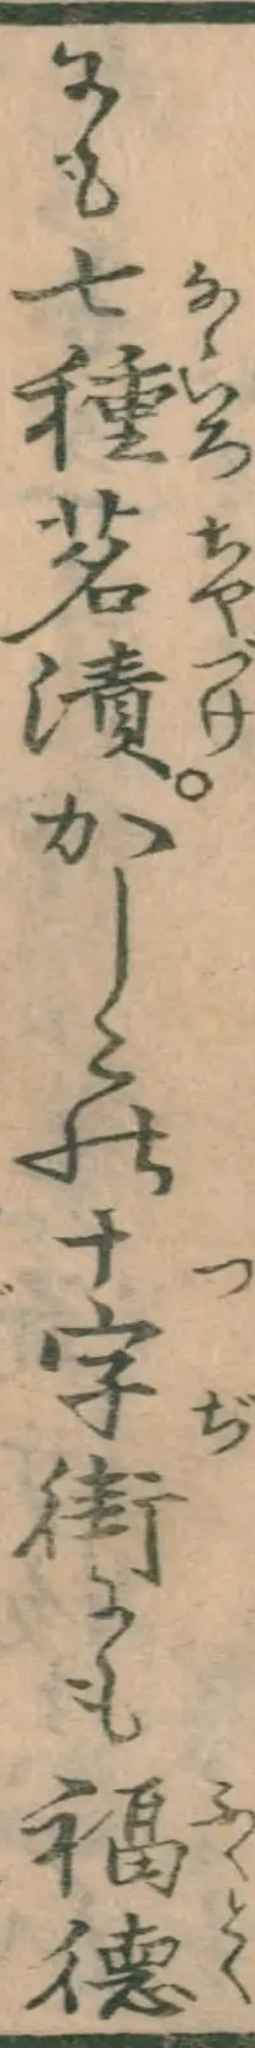にも七種茗漬。かしこの十字街にも福徳
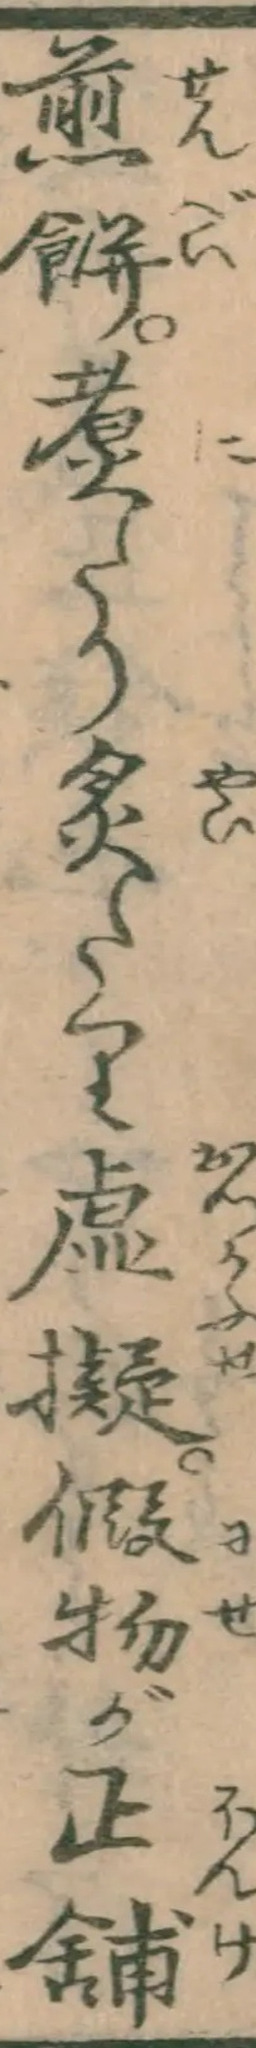煎餅。煮たり炙たり虚擬。仮物が正舗
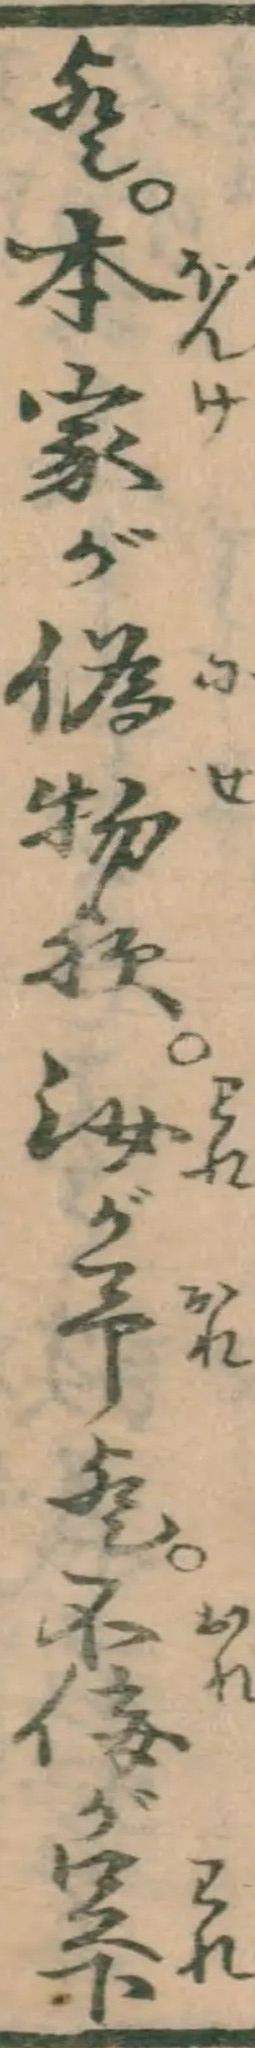歟。本家が偽物歟。汝が予歟。不侫が足下
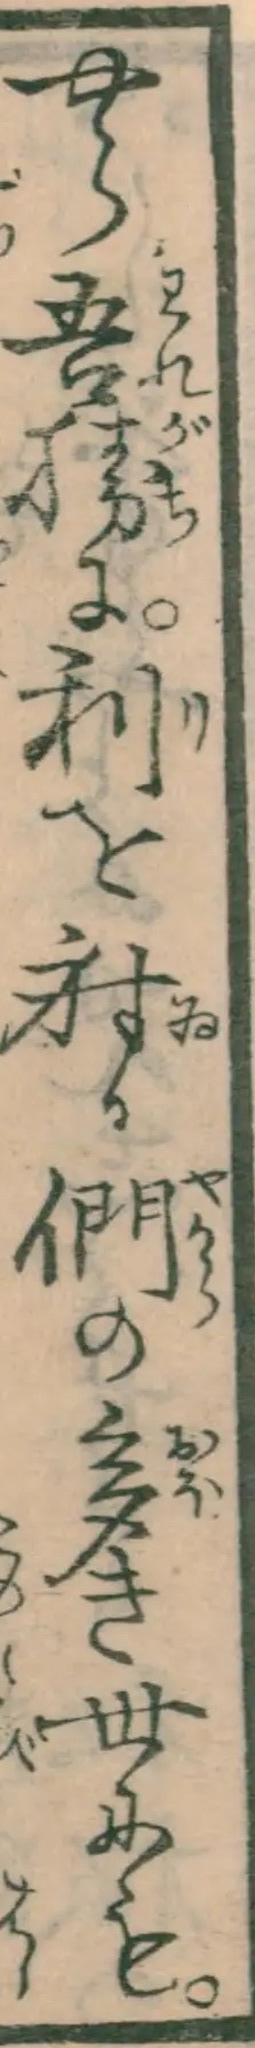やら吾勝に。利を射る們の多き世にも。
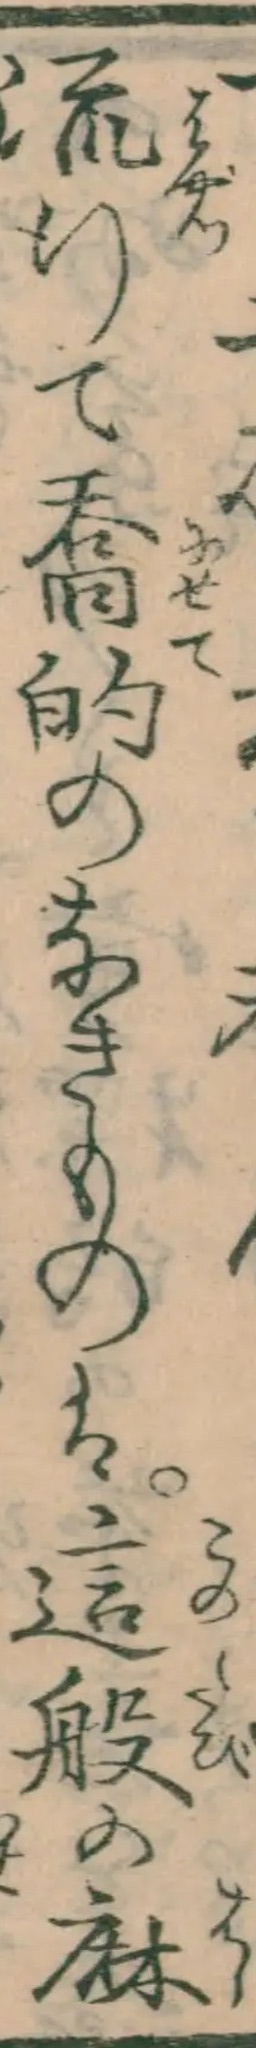流行て喬的のなきものは。這般の麻
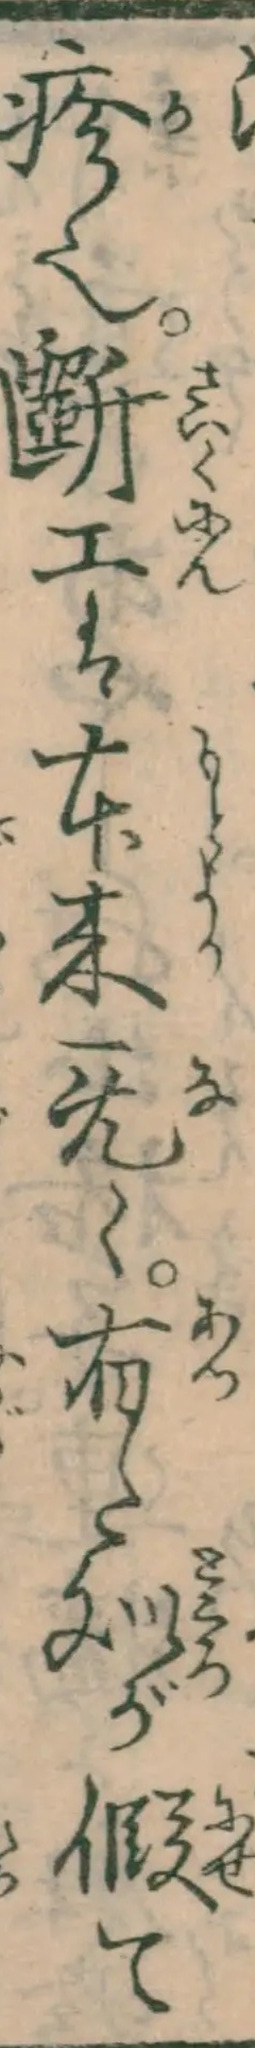疹也。斵工は本来无く。有た処が仮て
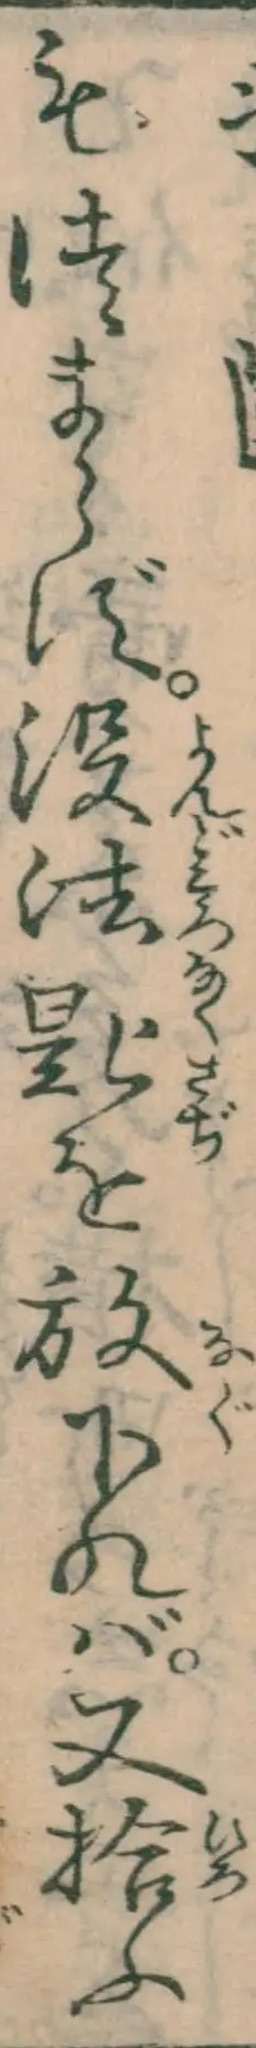もつまらず。没法匙を放下れば。又拾ふ
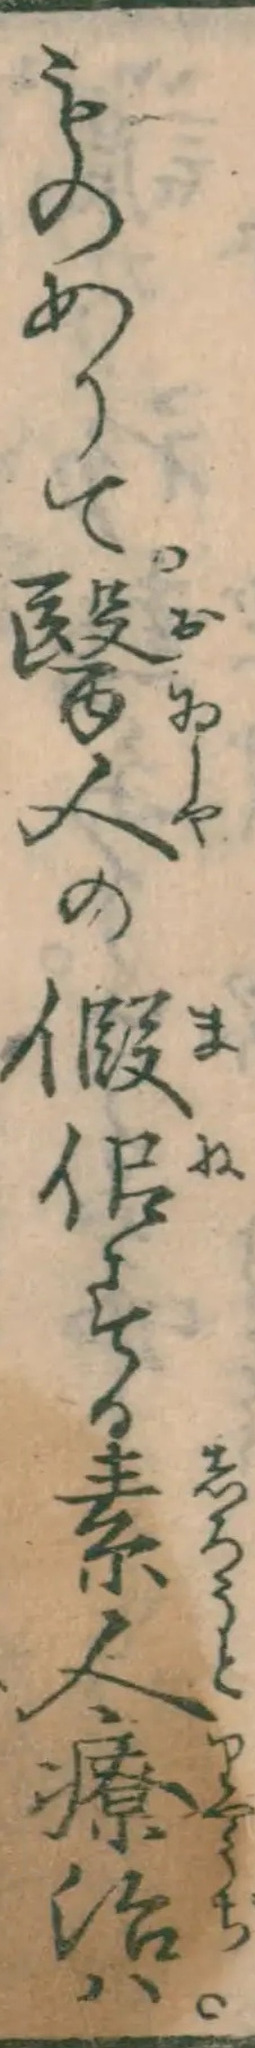ものありて。医人の仮佀する素人療治は。
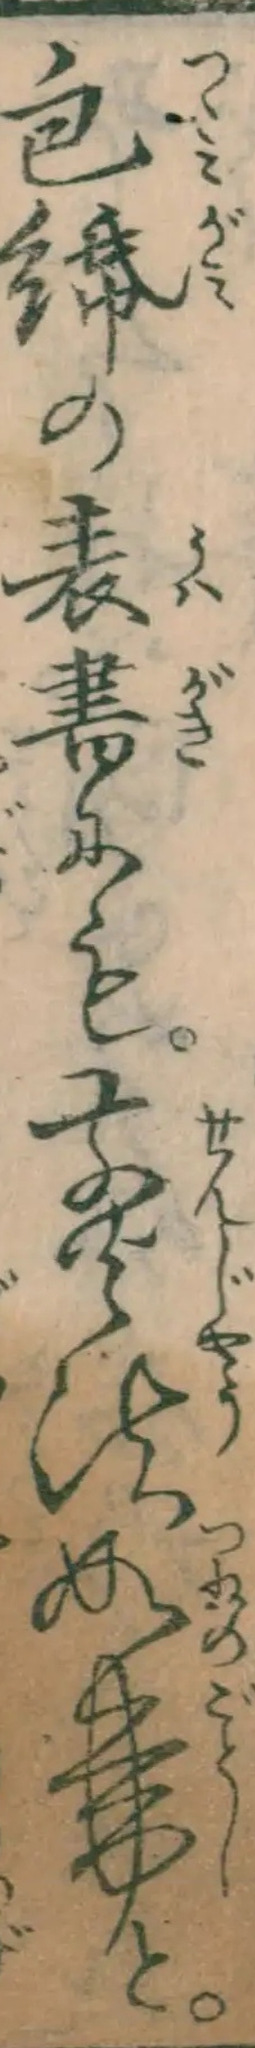包紙の表書にも。煎法如常と。
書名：麻疹戯言
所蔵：国立国会図書館 National Diet Library, JAPAN
